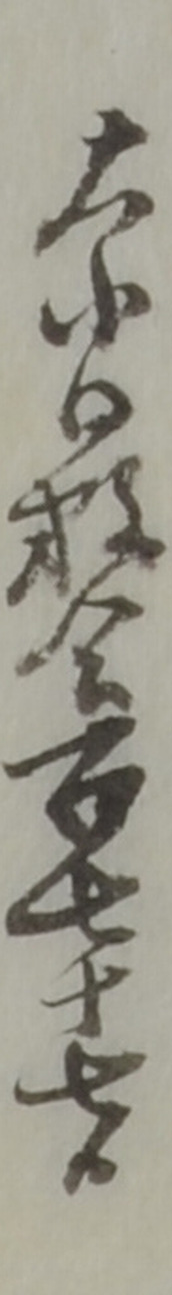大小日数合百七十七日
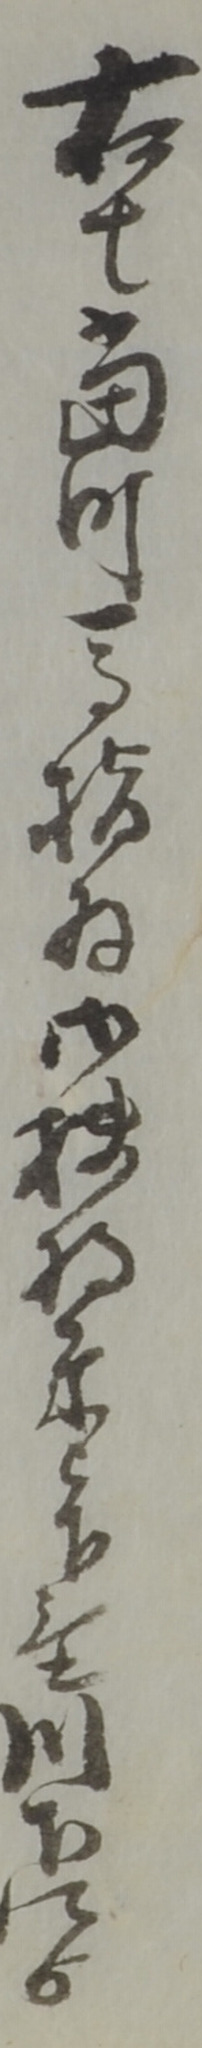右書当時馬指為御扶持米被下置川下郷ゟ
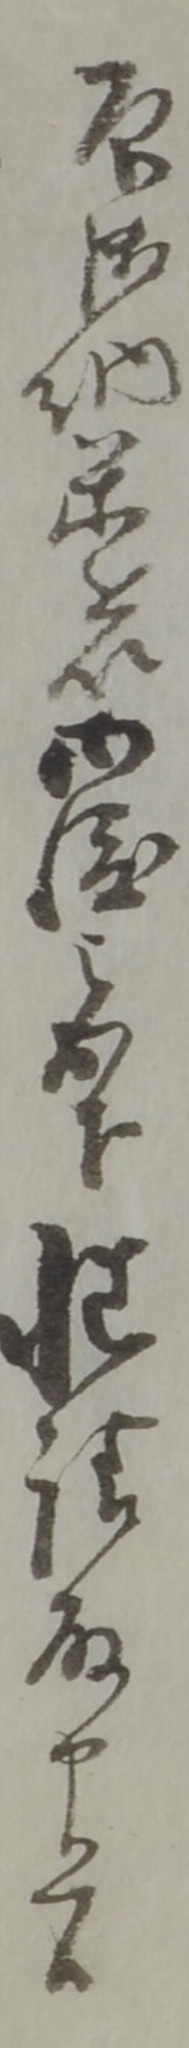辰御納米を以御渡被成下慥請取申上候
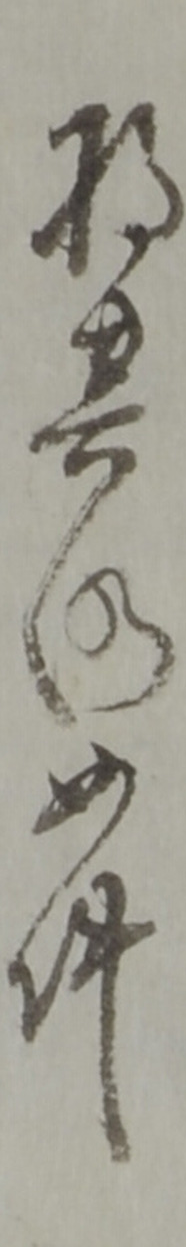為其仍如件
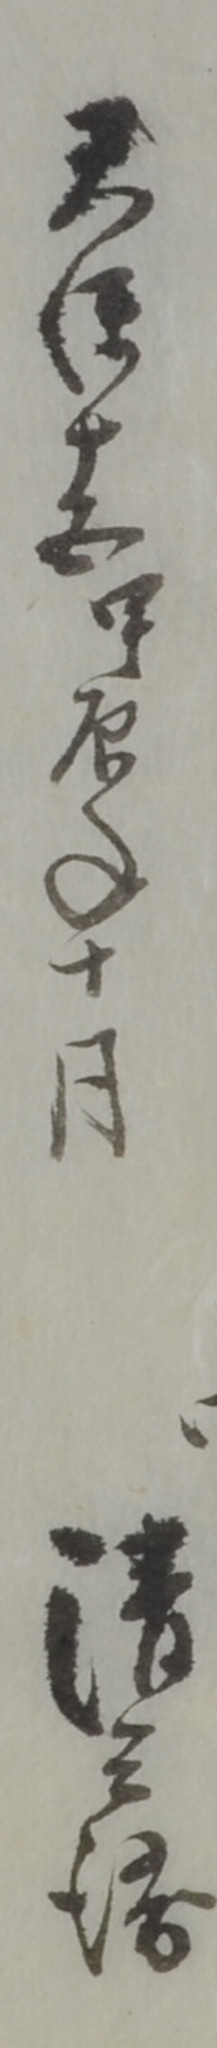天保十五甲辰年十月清兵衛
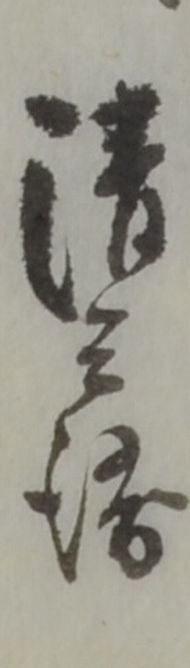清兵衛
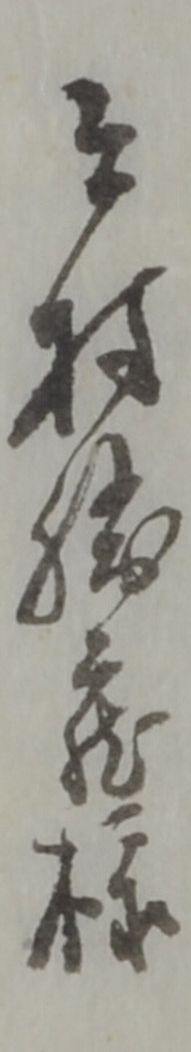今村勝蔵様

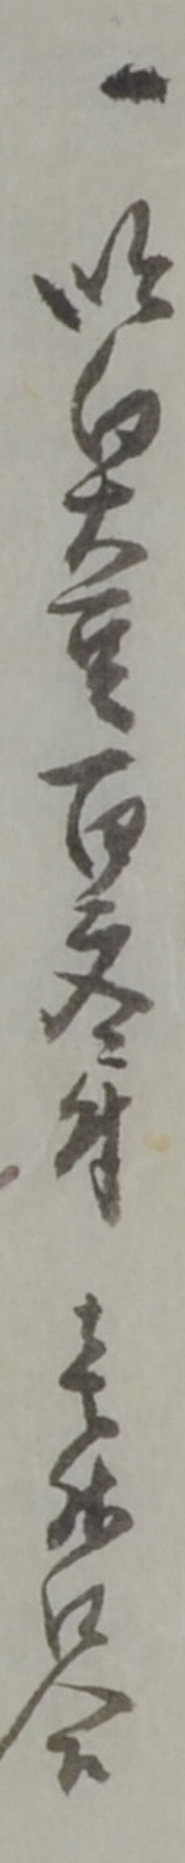一吟白大豆百文ニ付壱升四合
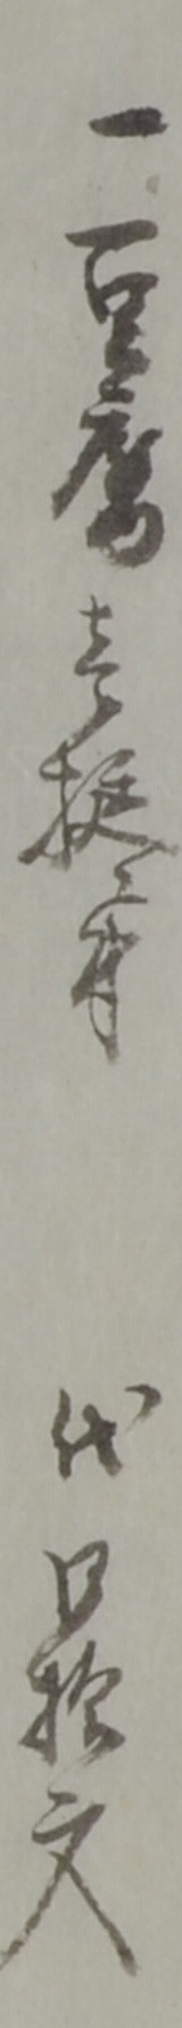一豆腐壱挺ニ付代四拾文
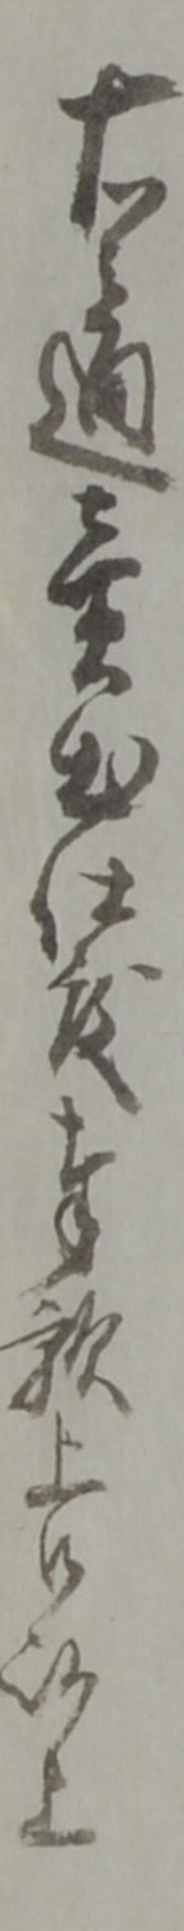右之通売出仕度奉願上候以上
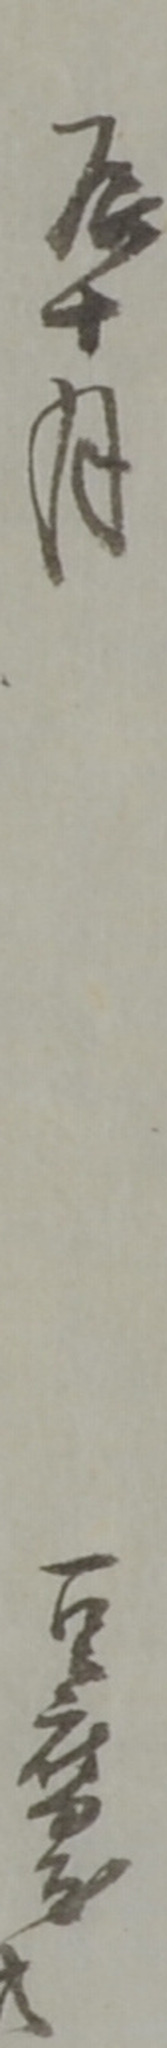辰十月豆腐屋
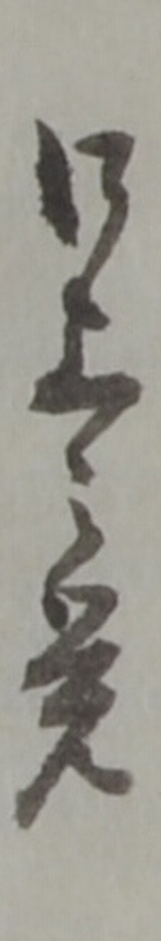口上之覚
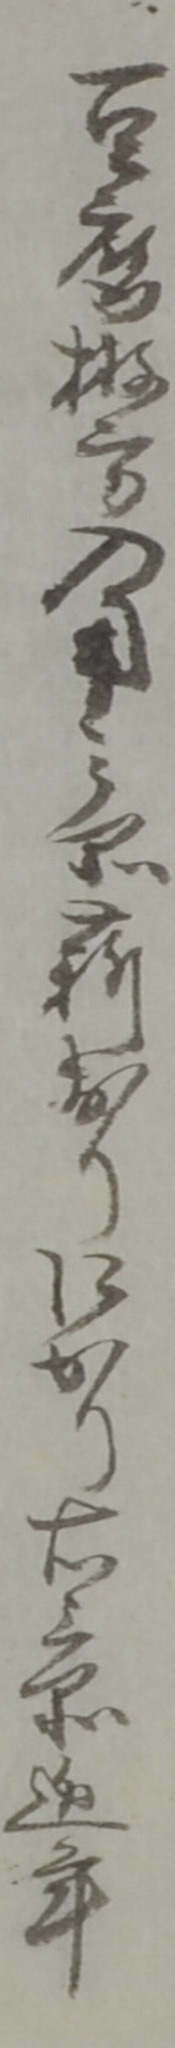豆腐拵方入用之品薪敷りにかり右三品近年
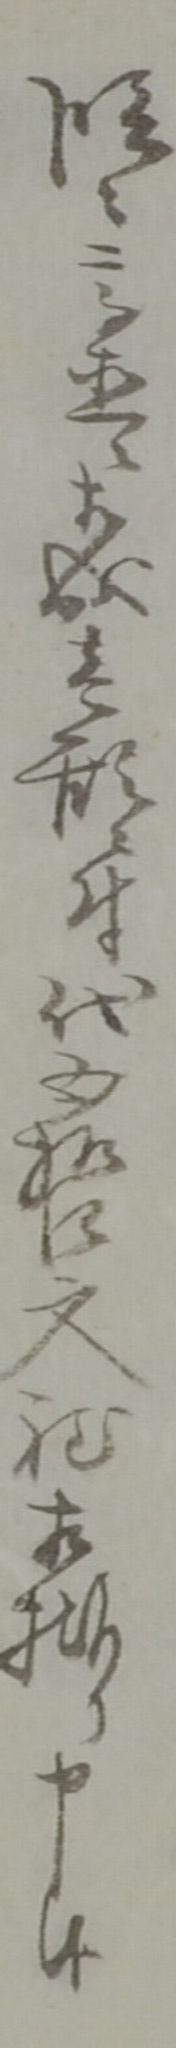段々高直ニ相成壱形ニ付代五拾四文程相掛り申候
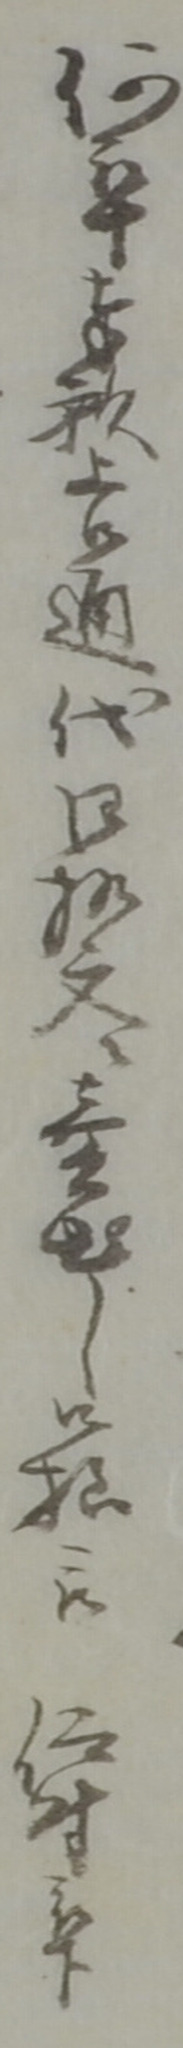何卒奉願上候通代四拾文ニ売出し候様被仰付被下
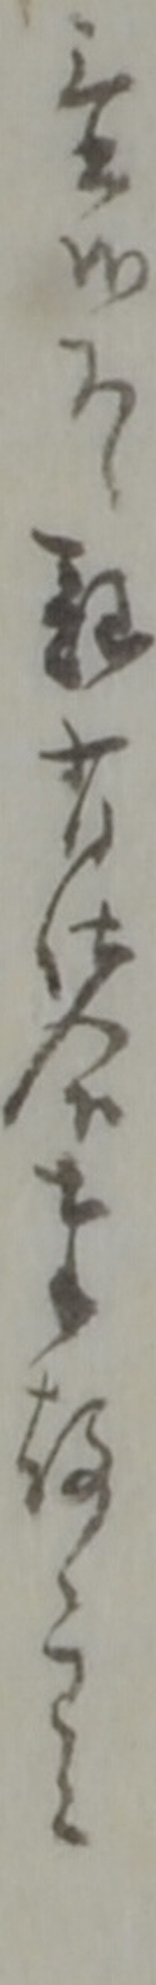置候ハヽ難有仕合奉存候以上
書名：諸願書控簿
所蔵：伊那市立高遠町図書館・合同会社AMANE
